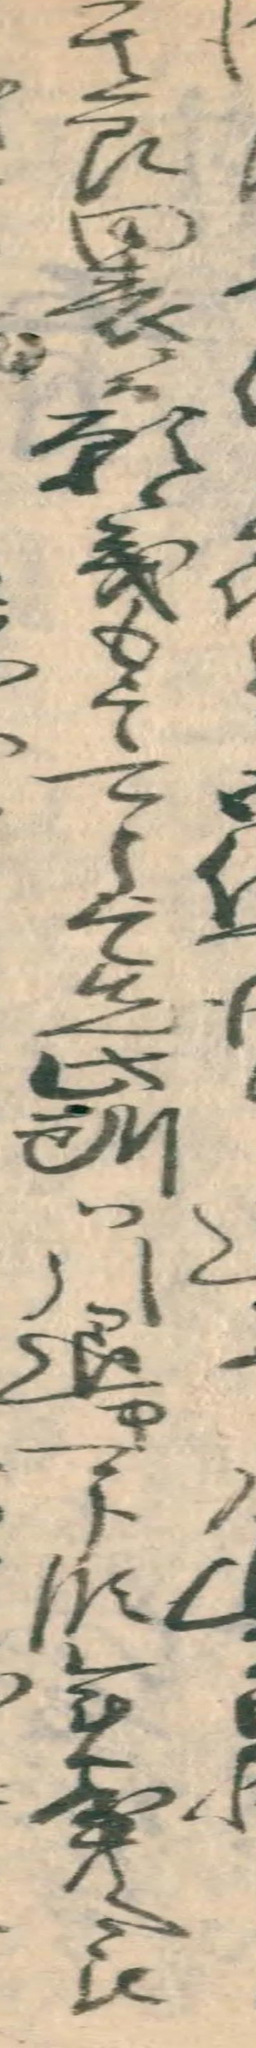其節田表ニ而願候義も候ハヽ其可申上候先此所ハ引退キ可申段年寄共へ被
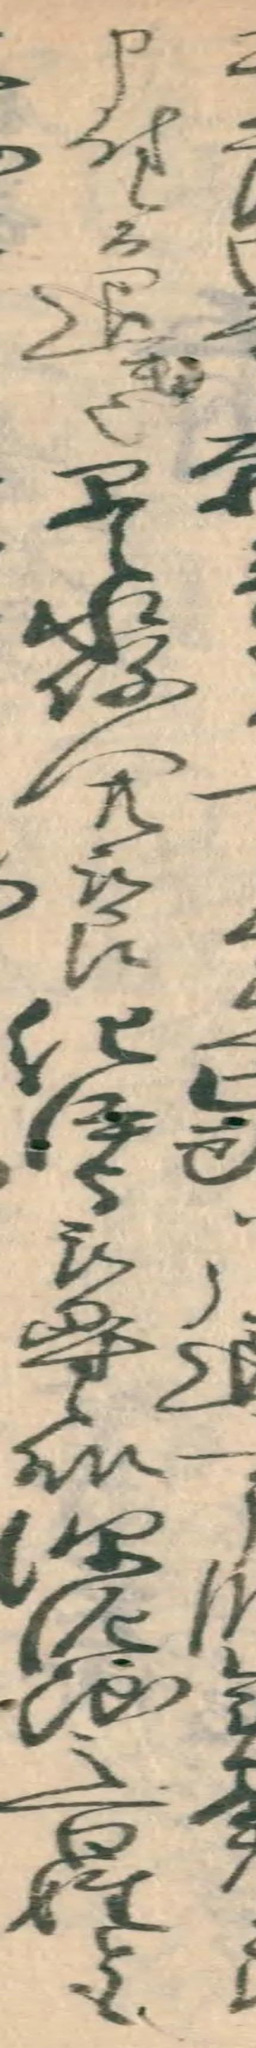申付候而退キ也早々水役人共被召紀伊守被尋候処深泥池之百姓とも
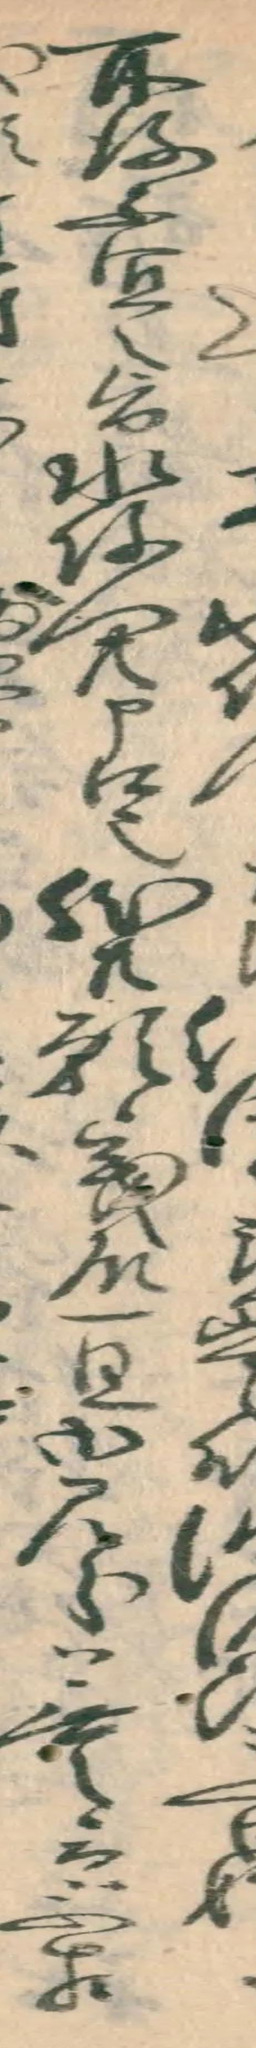所存不宜之旨水役人共申口也然共願候義故一旦御見分ハ無之候而ハ不相
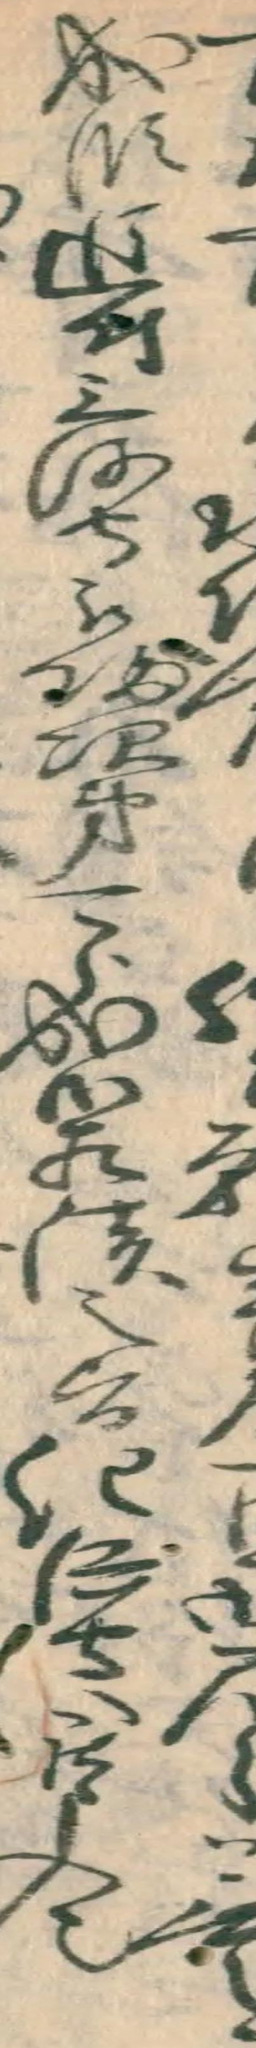成段追付三河守被帰次第可被成御相談之旨紀伊守へ被申入也
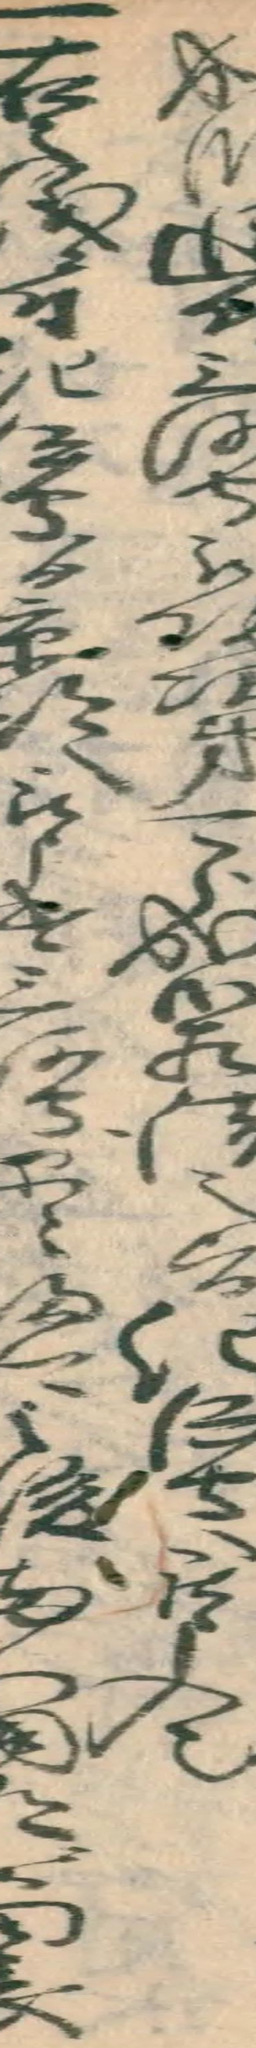一右之儀ニ付紀伊守ゟ京都へ被申遣三河守早々帰郷之後両人同道ニ而田表
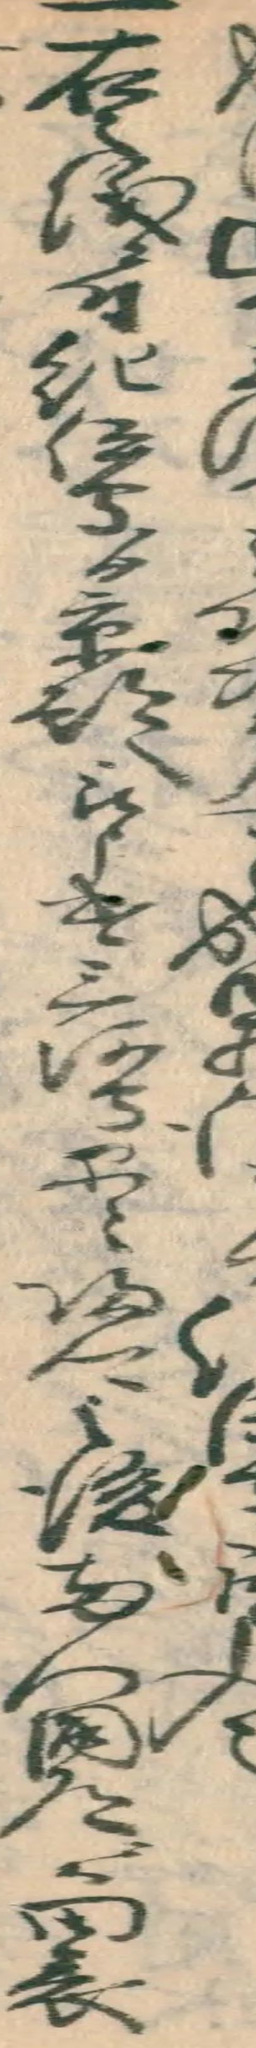一右之儀ニ付紀伊守ゟ京都へ被申遣三河守早々帰郷之後両人同道ニ而田表
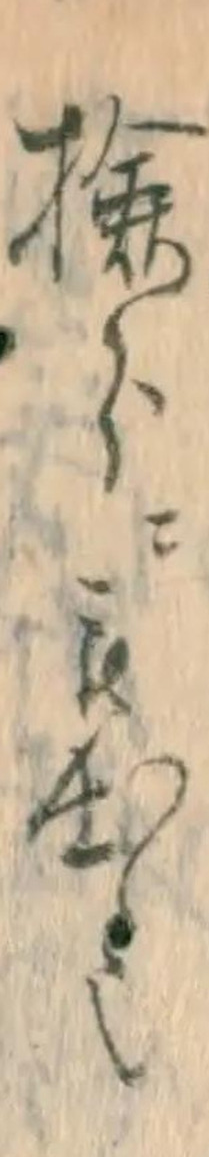検分ニ被出候也
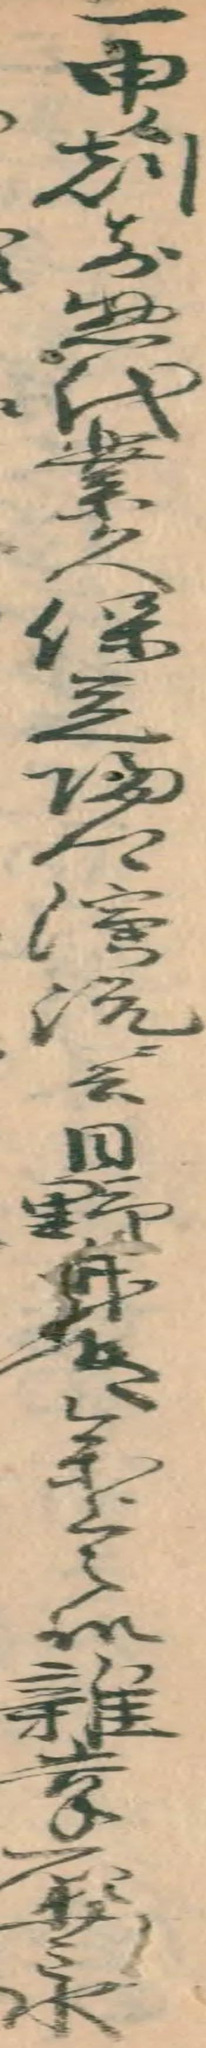一申ノ刻前惣代業久保覚帰郷演説ニ云日野弁殿へ参上之処雑掌石井主水
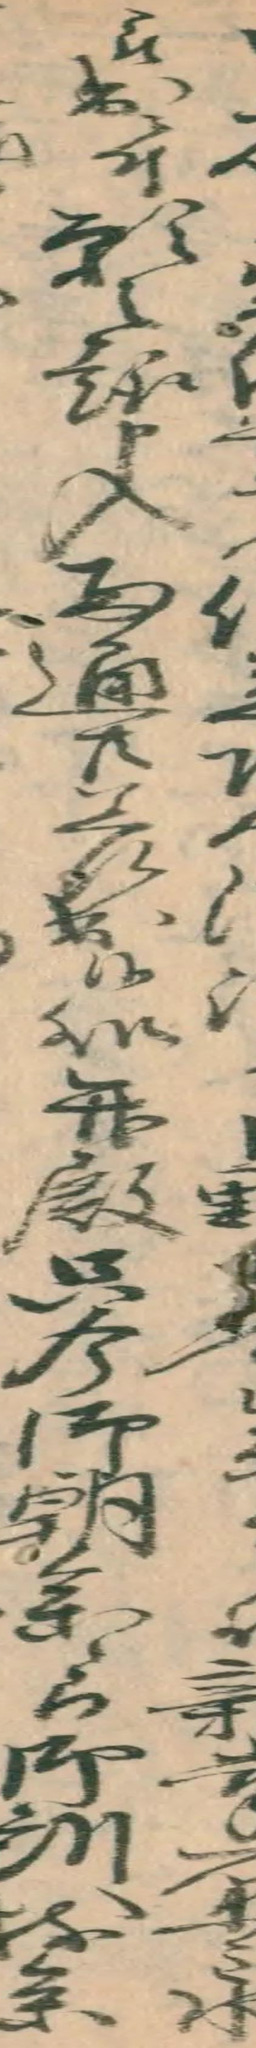被出ニ付願之趣申入両通共差出候処弁殿只今御朝参候間御所へ持参
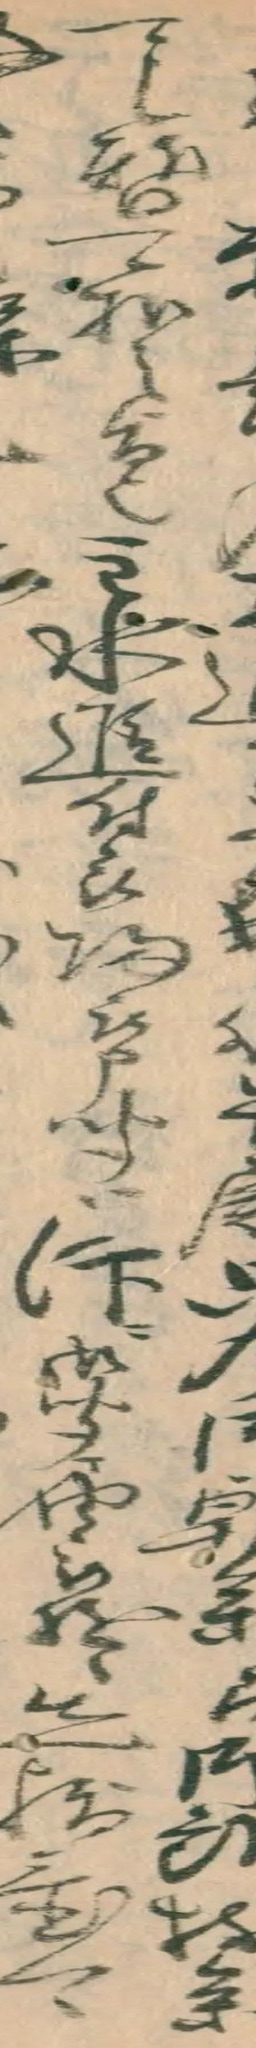可申候暫可扣之旨也主水追付被帰被申聞ハ仰ニ御聞届被遊候先指置可
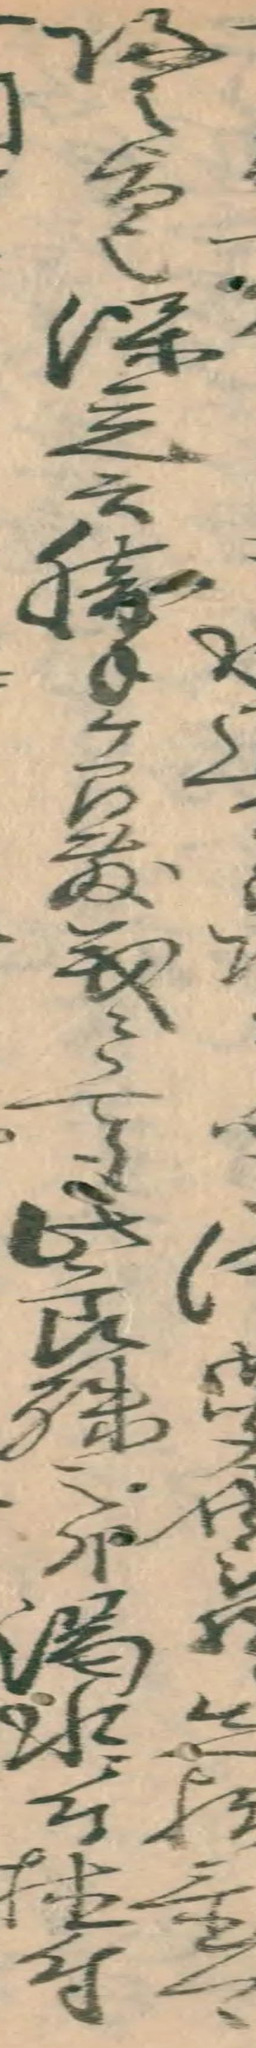帰之旨也保覚云勝手ケ間敷義ニ候へとも此節殊之外渇水ニ付植付
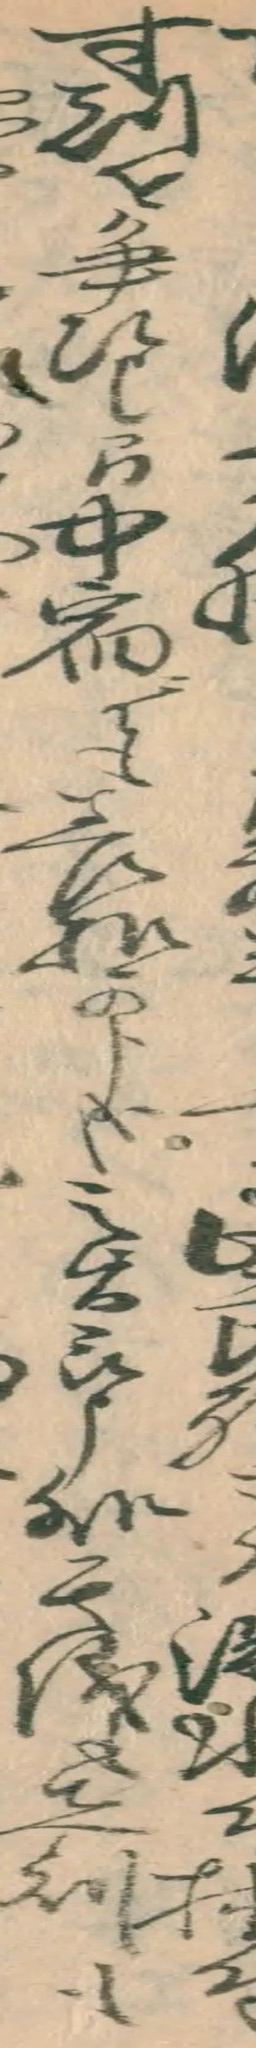寸刻を争ひ申候間中宿ニても差扣可申哉之旨被申処其儀も先刻も
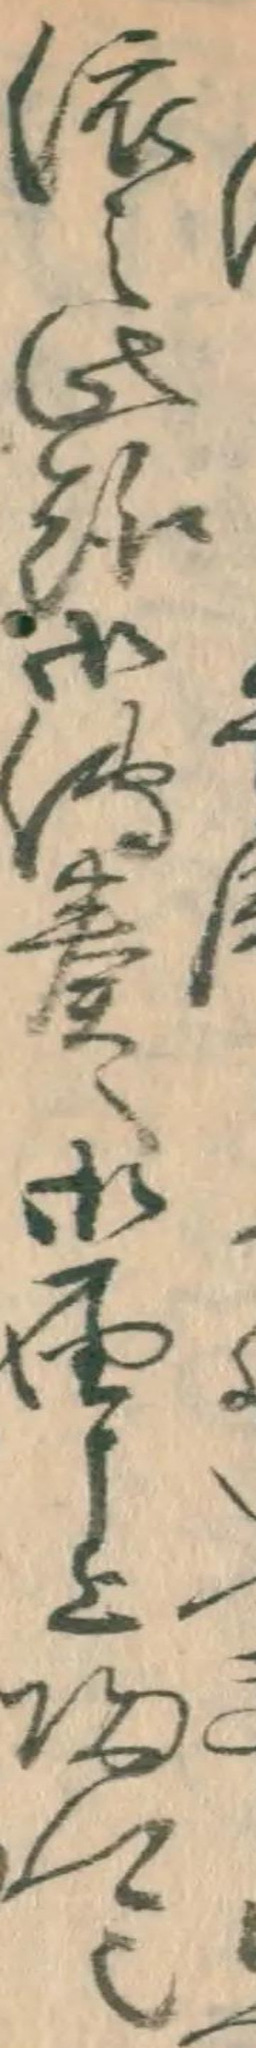依之此趣御伝奏へ御届申上帰郷也
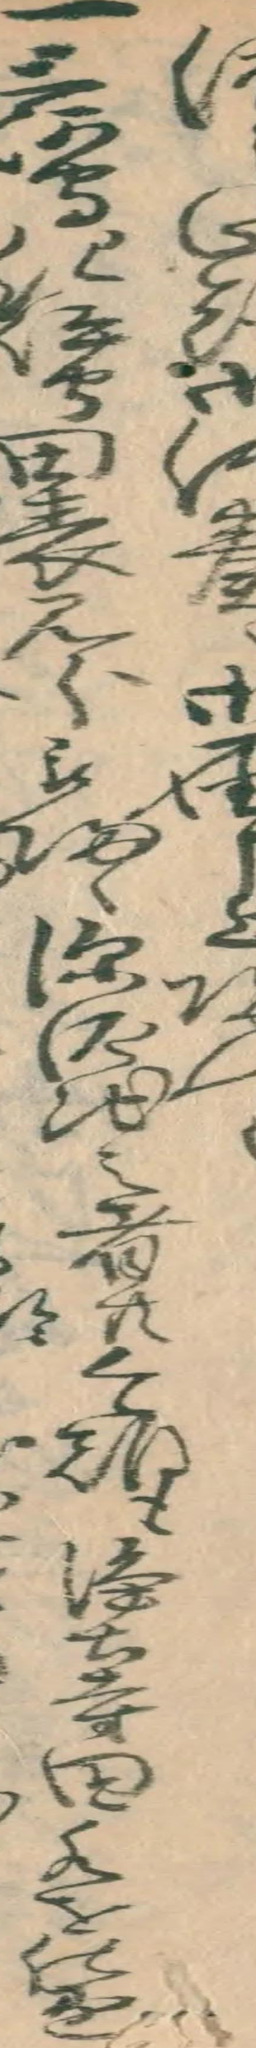一三河守紀伊守田表見分被帰候深泥池之者共今朝も浄土寺田水を仕懸
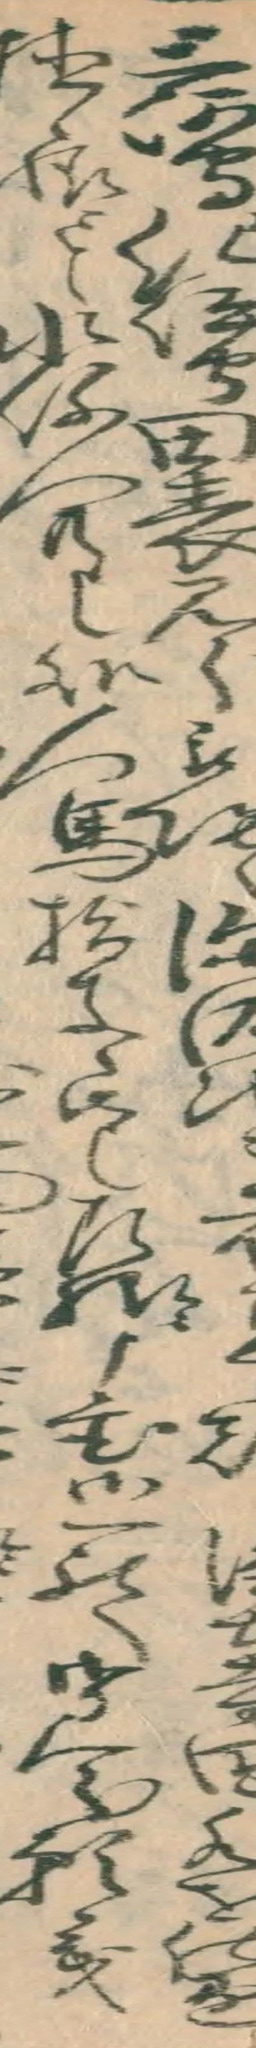植候様ニと水役人共申候処人馬指支候由申候左様ニ申置御一社へ御見分願候義
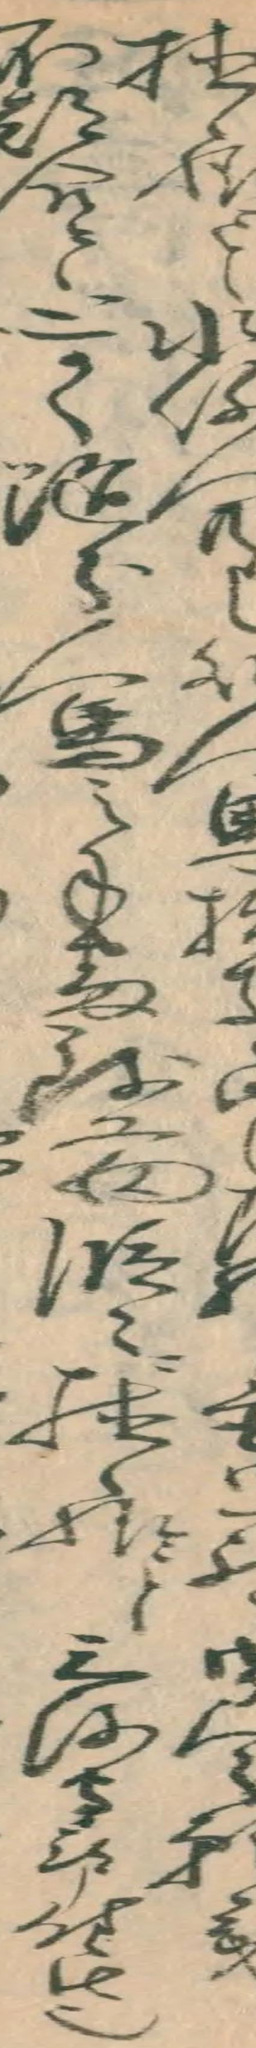不都合ニ候とかく随分人馬之手？番致工面段々ニ植様と三河守被申付候由也
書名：賀茂社記録. 第58冊
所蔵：国立国会図書館 National Diet Library, JAPAN
